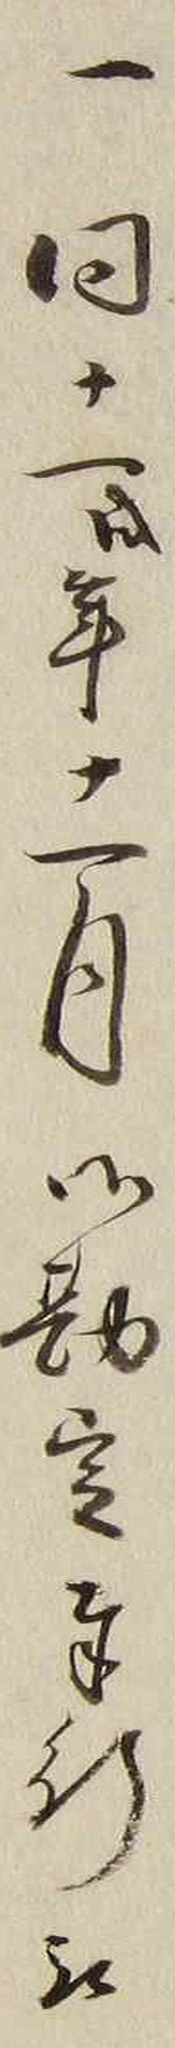一同十一戌年十一月御勘定奉行被
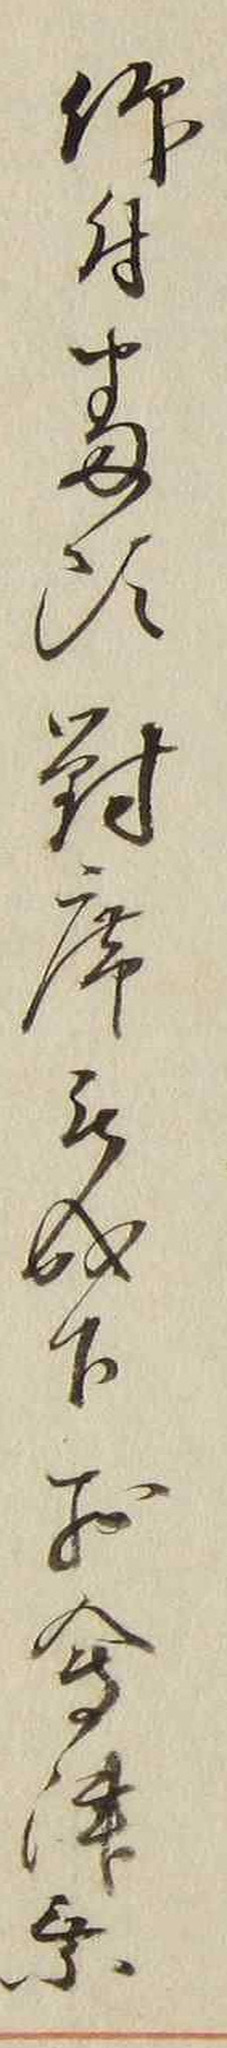仰付番頭対席被成下於会津乗

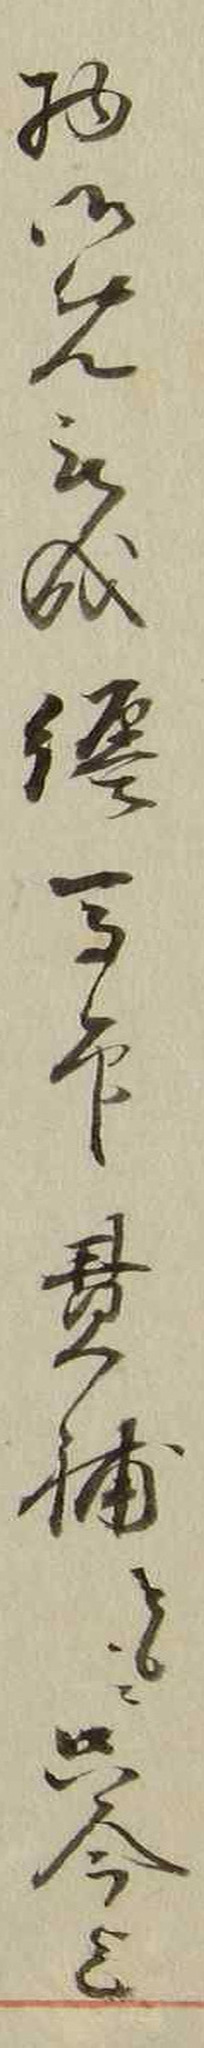物御免被成纏馬印費補ともた只今迄
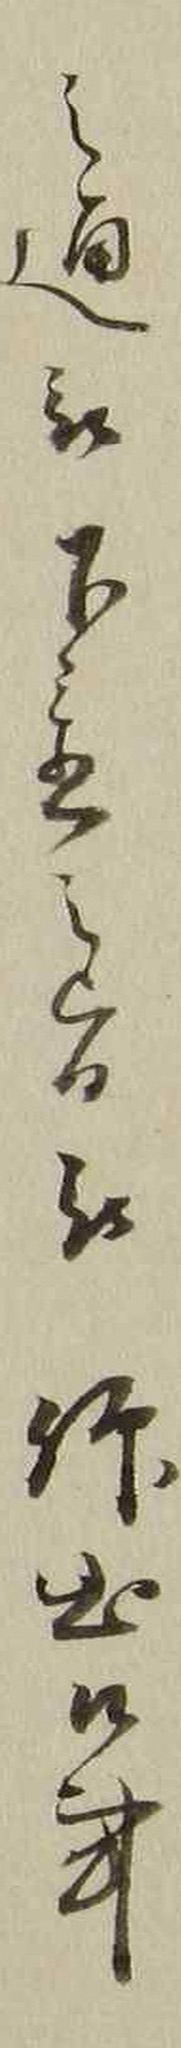之通被下置之旨被仰出候事
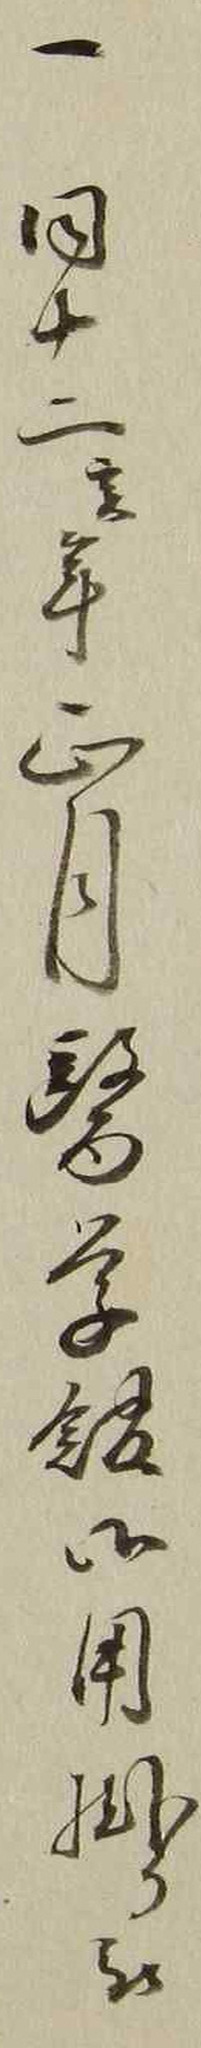一同十二亥年正月医学館御用掛り被
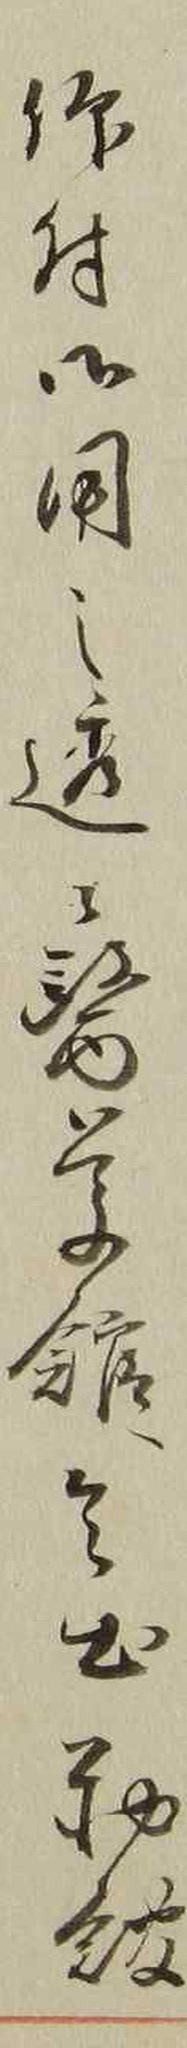仰付御用之透ニ医学館へ令出勤館
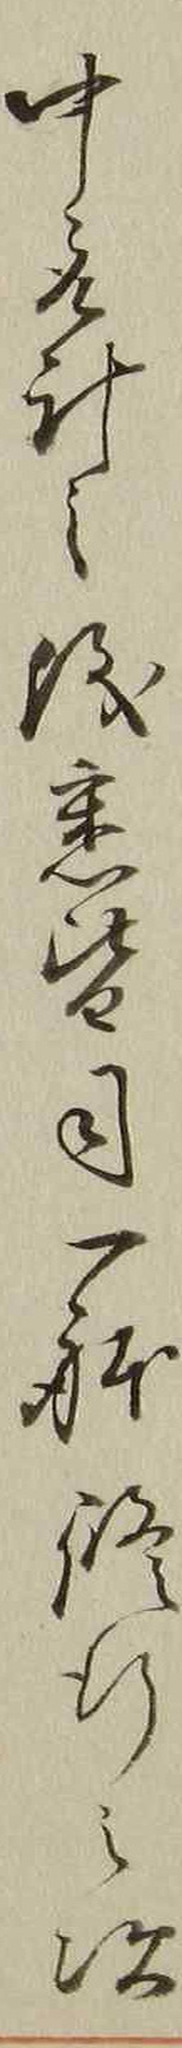中取計之儀悉皆月一躰修行之次
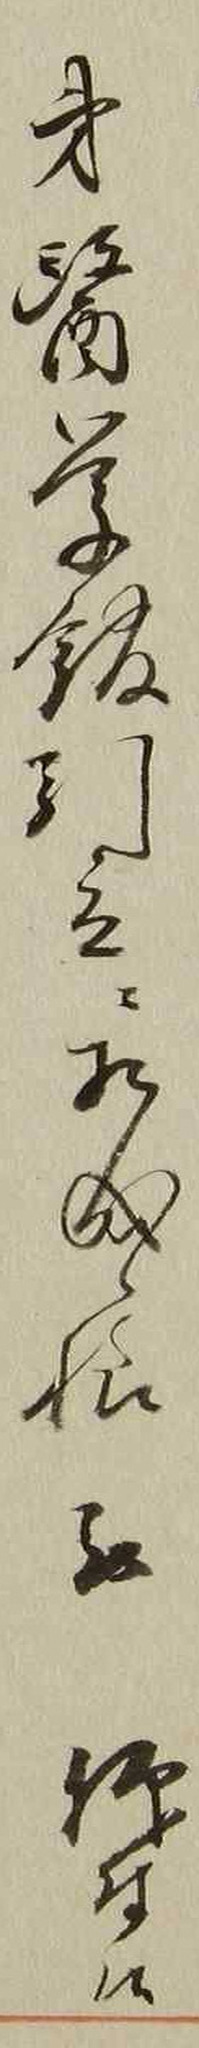弟医学館引立ニ相成候様被仰付候
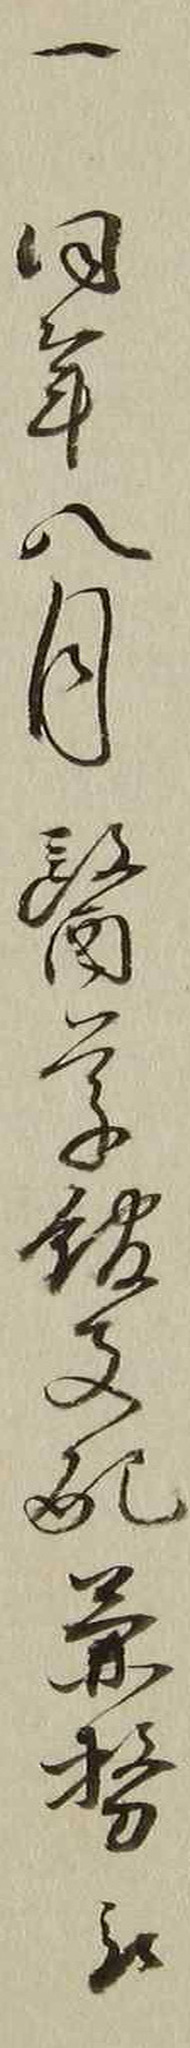一同年八月医学館支配兼務被
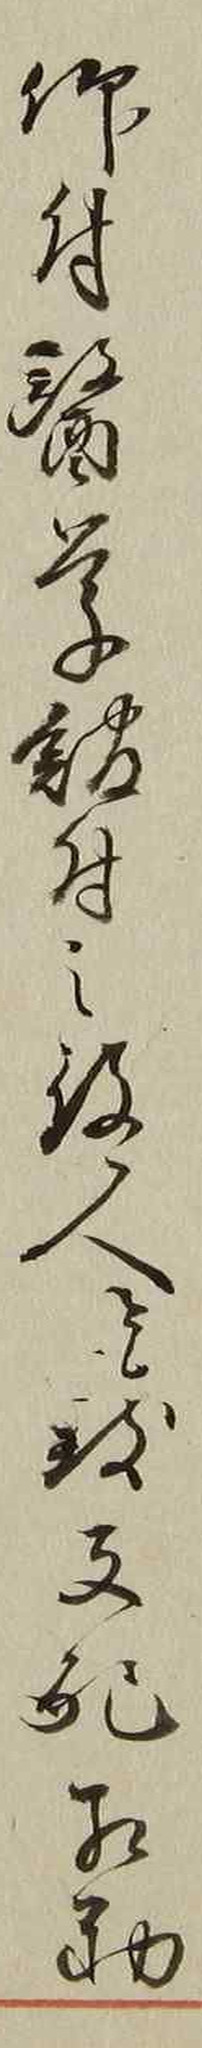仰付医学館付之役人をも致支配相勤
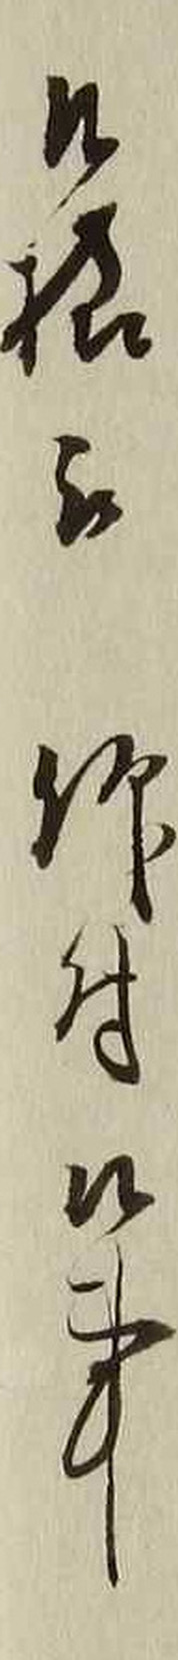候様被仰付候事
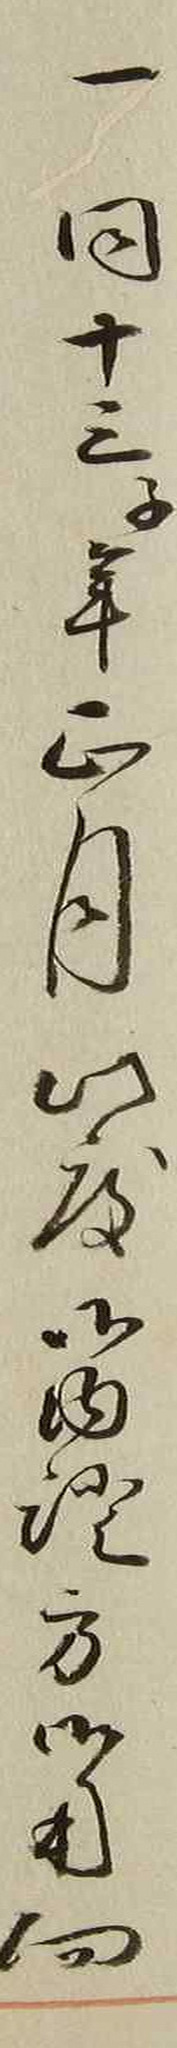一同十三子年正月此度御内證方御用向
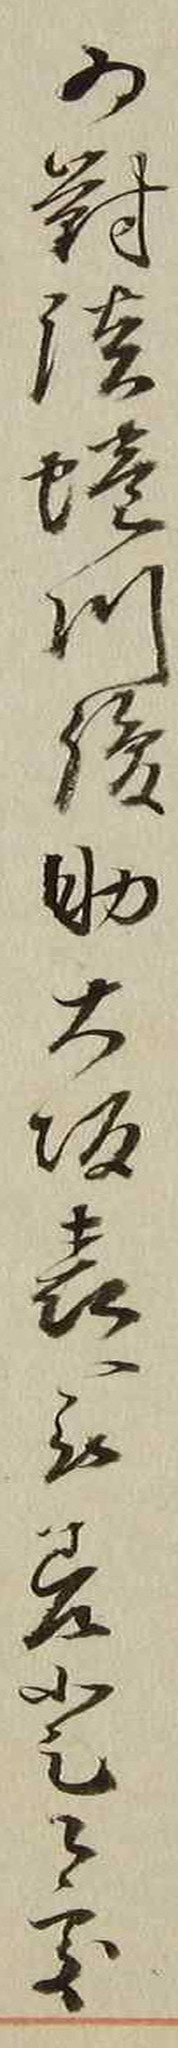為対談境川俊助大坂表へ被差登候義
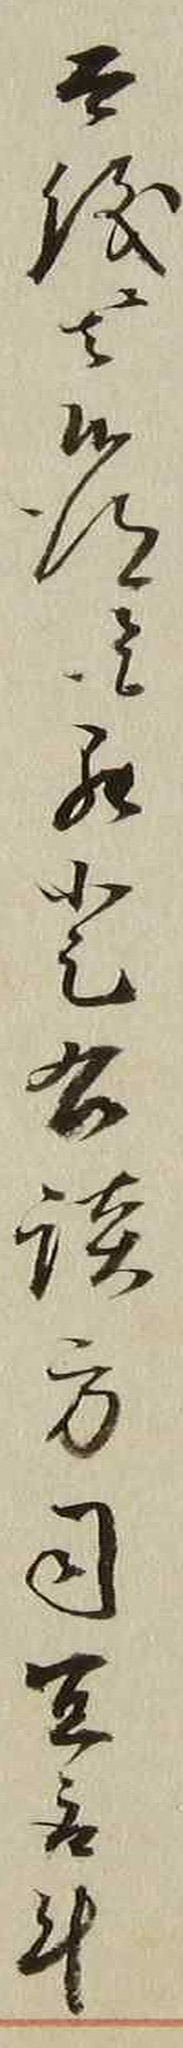太儀ニ者候得とも罷登右談方司宜取斗
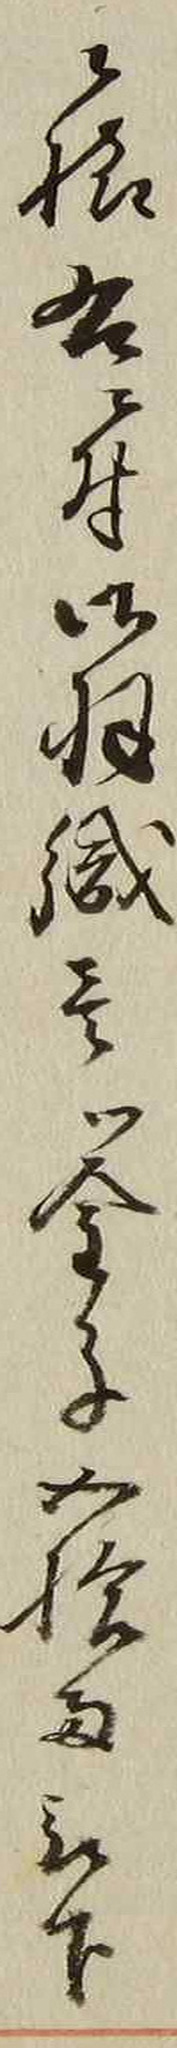候様右ニ付御羽織壱ツ金子五拾両被下
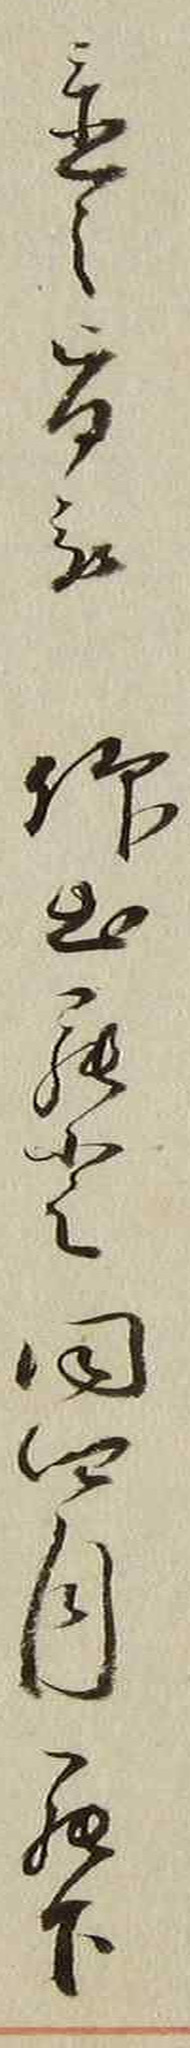置候旨被仰出罷登同四月罷下
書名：諸士系譜　巻之204　や之部1
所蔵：会津若松市立会津図書館
